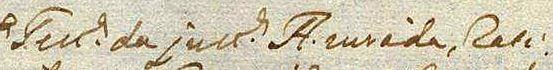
Test.a da just.a A. iurada, Rati
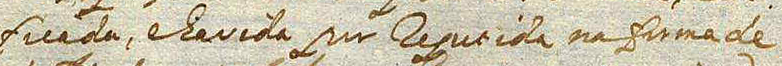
ficada, e havida per Repetida na forma de
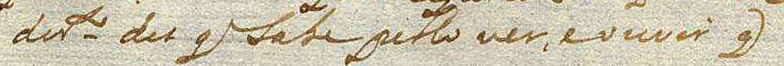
dir.to dis q̄ sabe pello uer, e ouvir q̄
